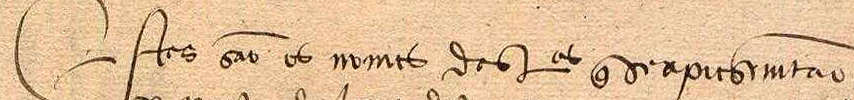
Estes são os nomes das tas q̄ se apresemtão
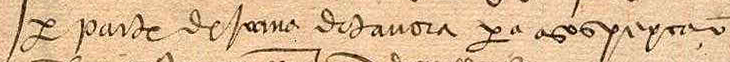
ꝑ parte de Joana de tauora ꝑa a sospeyção
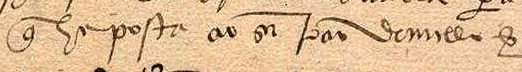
q̄ he posta ao s̄or João de mello
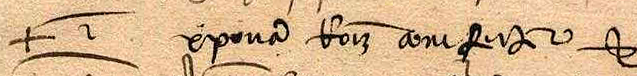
+ item xpouā Rōiz comfeitro
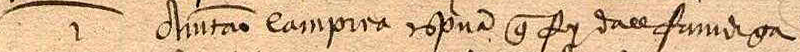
item Amtão lamprea espiuā q̄ foy dallfamdega
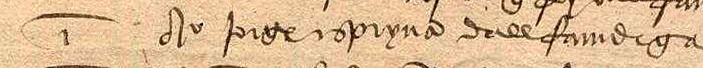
item Ao Jorge espryuā dallfamdega
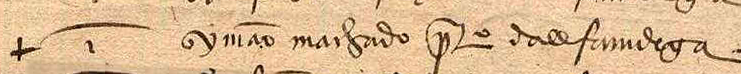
+ item symão machado p̄to dallfamdega
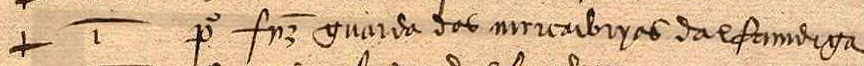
+ item po frrz̄ guarda dos mercadoryas dalfamdega
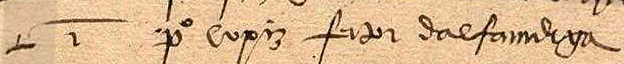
+ item po lopez feitor dalfamdega
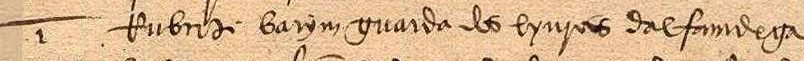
item Ruberte barym guarda dos lyuros dalfamdega
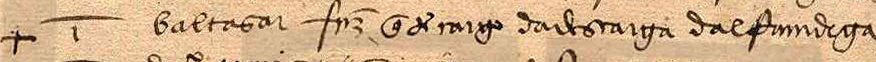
+ item baltasar frrz̄ q̄ tē cargo da descarga dalfamdega
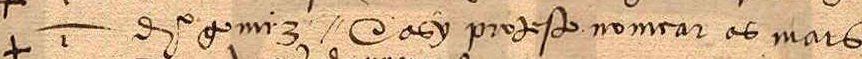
+ item djo gomez / e asy protesto nomear as mais
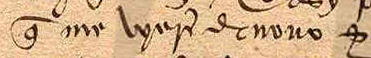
q̄ me vyerē de nouo
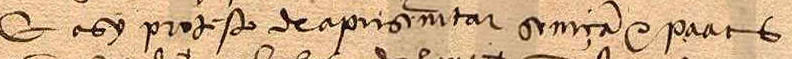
E asy protesto de apresemtar semçā e paaes
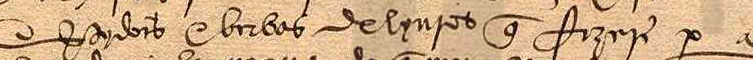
e ꞩtydoẽs e verbas de lyuros q̄ fizerē ꝑa
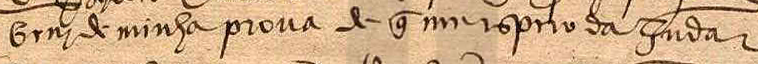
bem de minha proua de q̄ me espero daJudar
